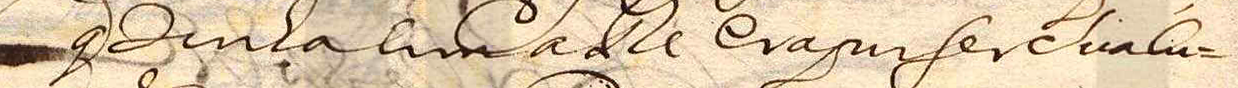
q̄ tinha com a Re era por ser sua Cu
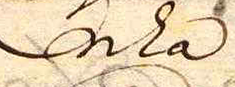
nha
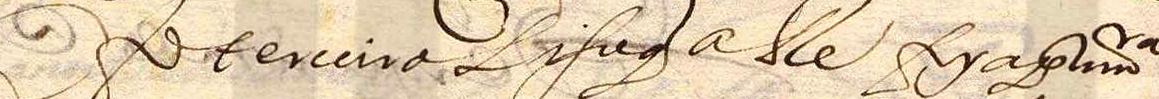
Ao terceiro, Disse q̄ a Re foy a pRim.ra
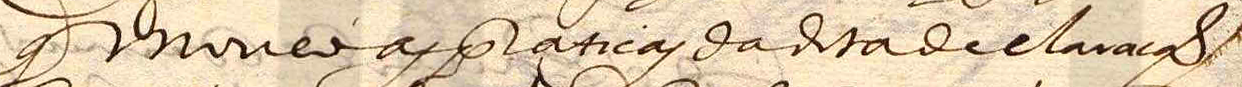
q̄ moueo as praticas da dita declaraçaõ
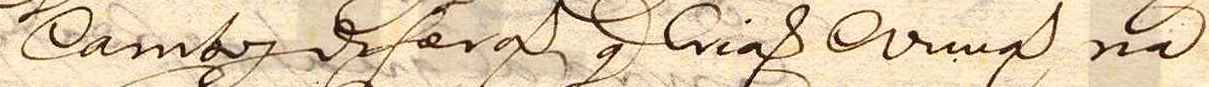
E ambos diseraõ q̄ Criaõ e viuiaõ na
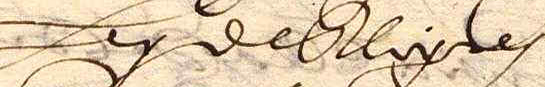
Ley de Moyzes
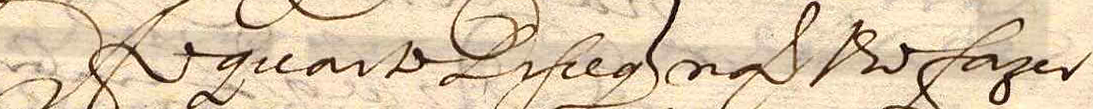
Ao quarto Disse q̄ naõ vio fazer
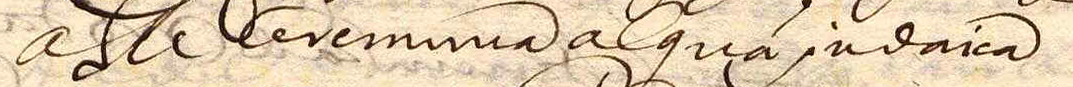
a Re ceremonia alguā judaica
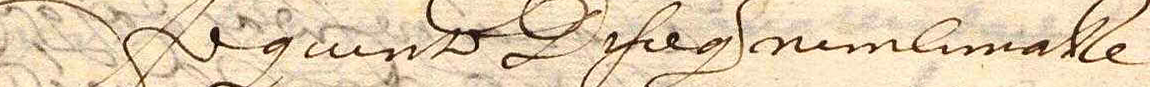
Ao quinto Disse q̄ nem com a Re
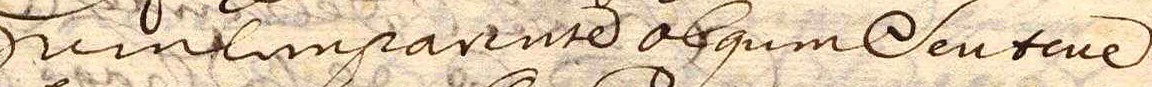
nem com parente algum Seu teue
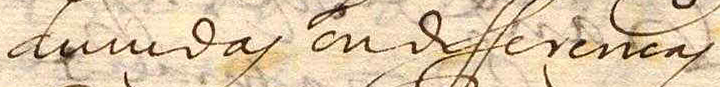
duuidas ou differenças
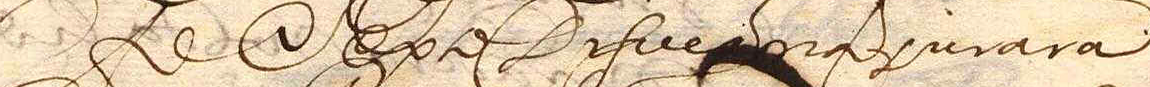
Ao Sexto Disse _ naõ jurara
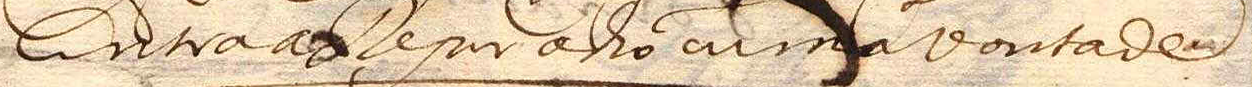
Contra a Re por odio ou ma vontade
